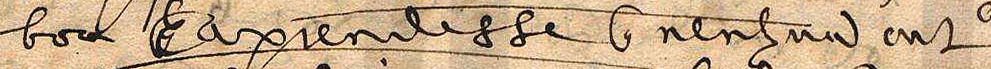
boa E aprendesse q̄ nenhuā outa
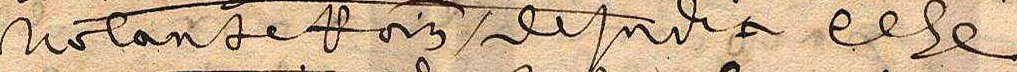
violante Rōiz / de Judia e lhe
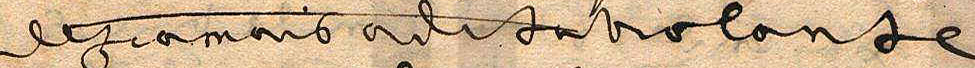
dezia mais a dita violante
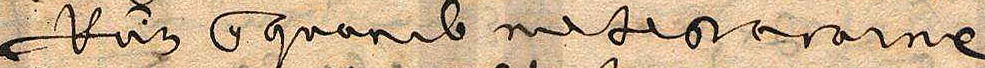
Rōiz q̄ quando metese a carne
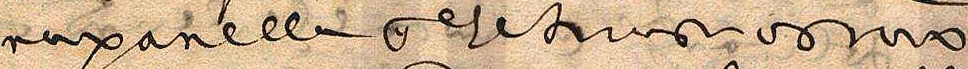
na panella q̄ lhe tirase o seuo
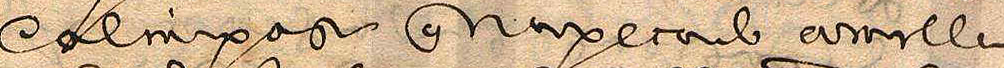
e a limpase q̄ era pecado comella
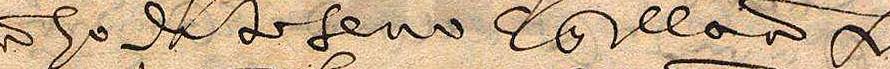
cō ho dito seuo E q̄ ella cōfe
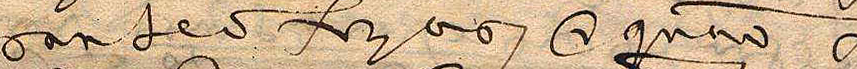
sante o fez asj ēquãoto
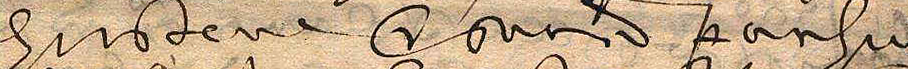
ahi esteue ē sua cōpanhia
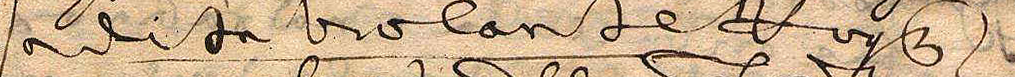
a dita violante Royz̄
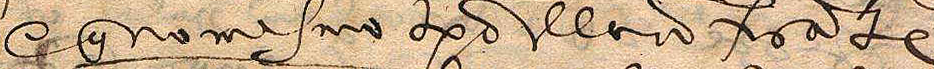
e q̄ no mesmo tpō ella cōfesāte
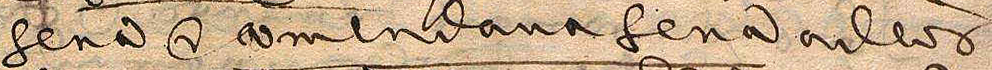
se nā ēcomendaua senā a deos
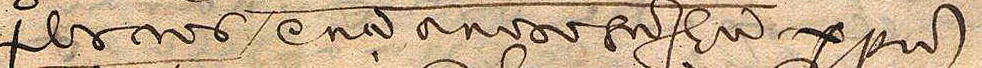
dos ceos / e nā a noso sor Jhū xpō
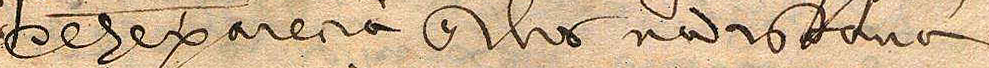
e lhe parecia q̄ deos nā estaua
